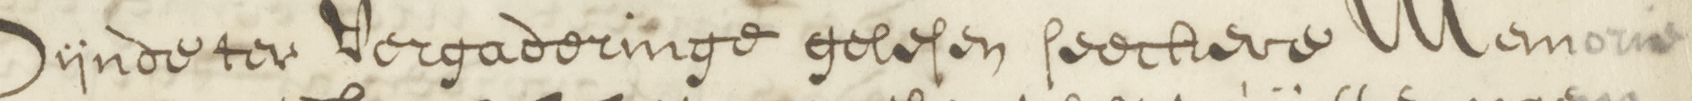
Sijnde ter Vergaderinge gelesen seeckere Memorie
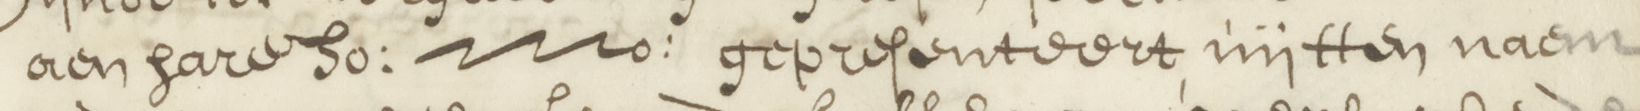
aen hare ho:Mo: gepresenteert uijtten naem
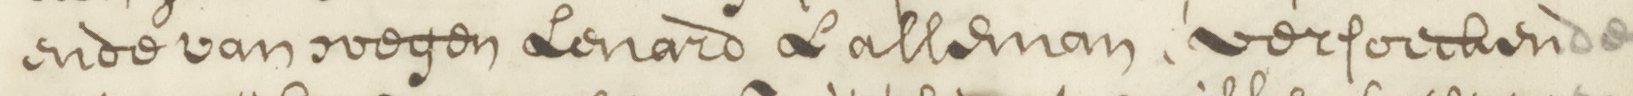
ende van wegen Lenard Lalleman, versoeckende
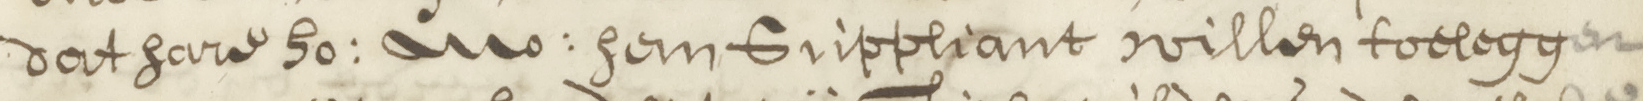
dat hare ho:Mo: hem Suppliant willen toeleggen
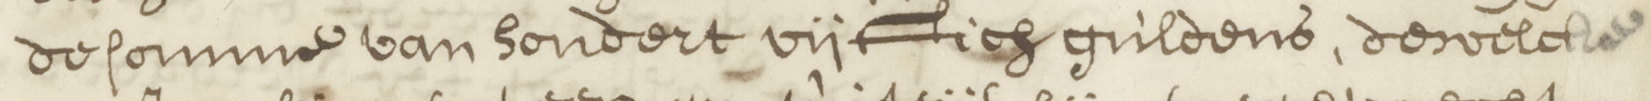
de somme van hondert vijftig guldens, dewelcke
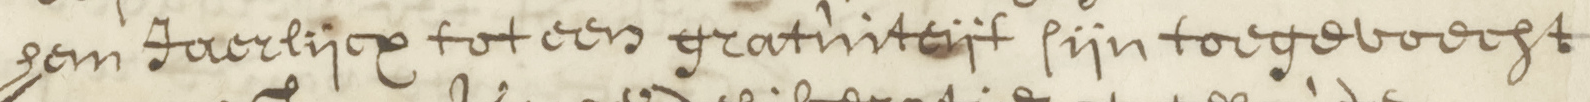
hem Jaerlijcx tot een gratuiteijt sijn toegevoecht
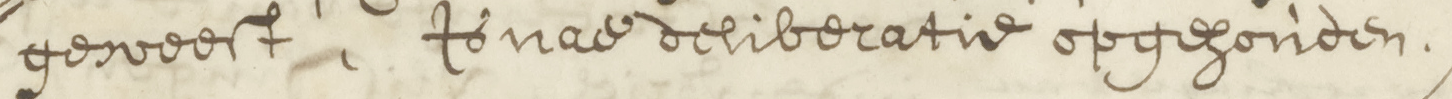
geweest. Is nae deliberatie opgehouden.
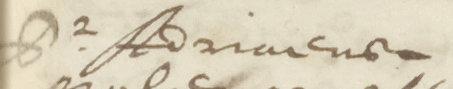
Pr. Adriaens
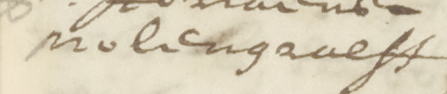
molengraeff
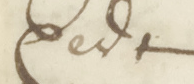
Eede
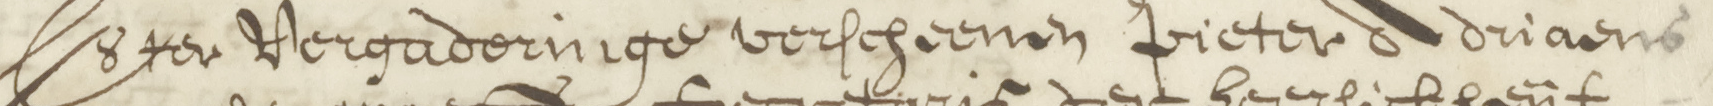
Is ter Vergaderinge verscheenen Pieter Adriaens
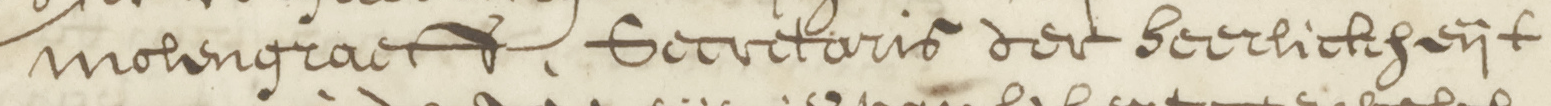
molengraeff, Secretaris der heerlickheijt
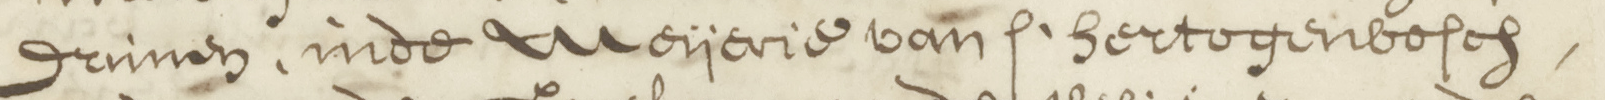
Drunen, inde Meijerie van s'hertogenbosch,
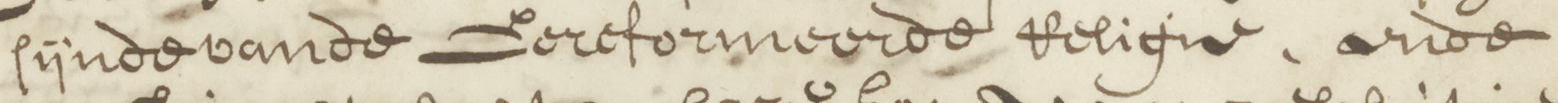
sijnde vande Gereformeerde Religie, ende
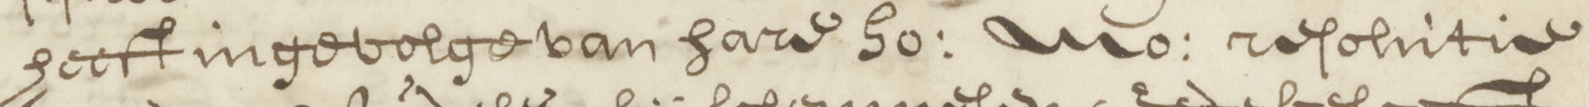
heeft ingevolge van hare ho:Mo: resolutie
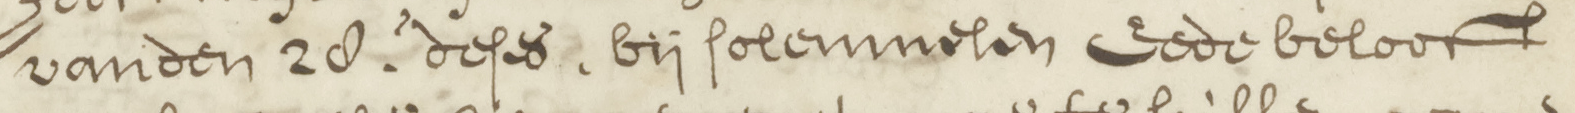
van den 28e. deses, bij solemnelen Eede belooft
